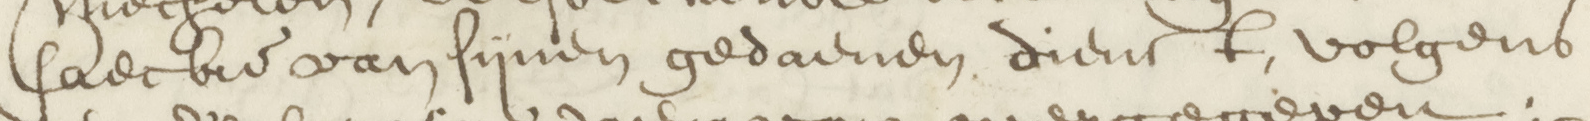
saecke van sijnen gedaenen dienst, volgens
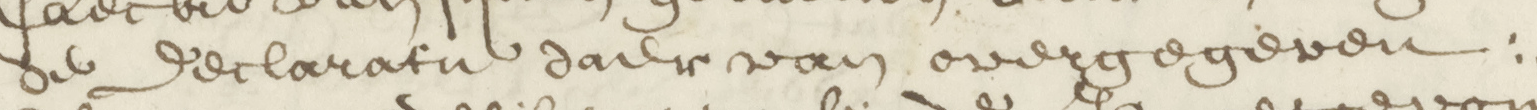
de declaratie daer van overgegeven:
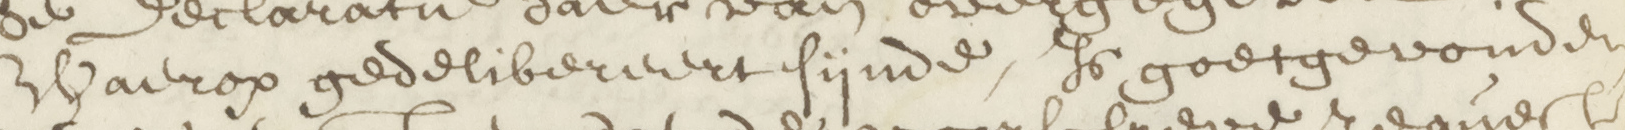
Waerop gedelibereert sijnde, Is goetgevonden
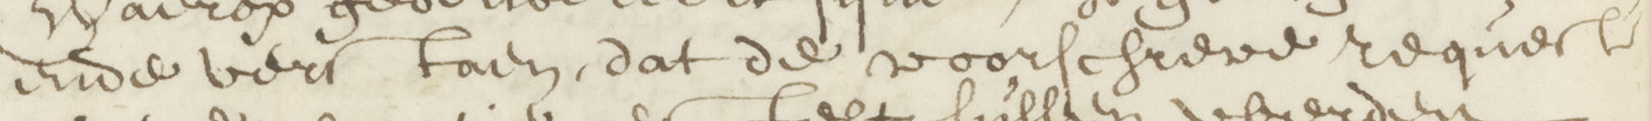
ende verstaen, dat de voorschreve requeste
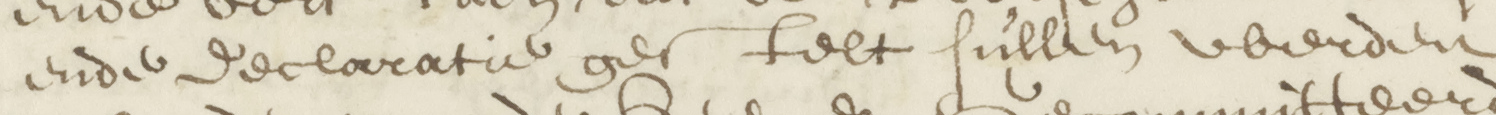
ende declaratie gestelt sullen werden
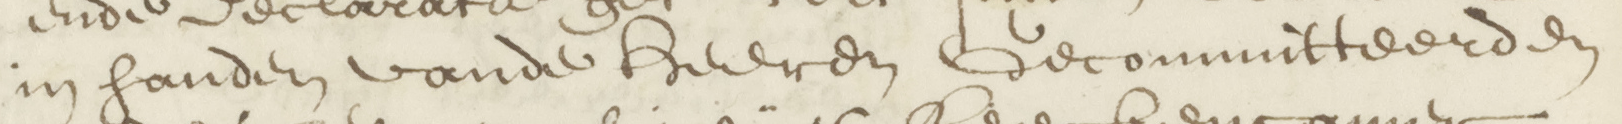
in handen vande Heeren Gecommitteerden
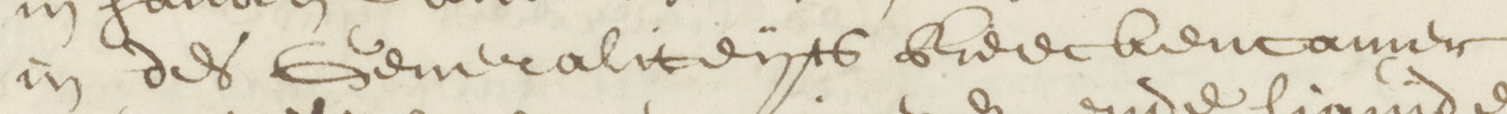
in des Generaliteijts Reeckencamer
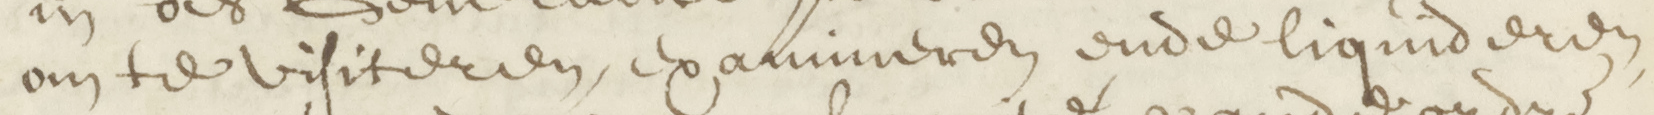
om te visiteren, examineren ende liquideren,
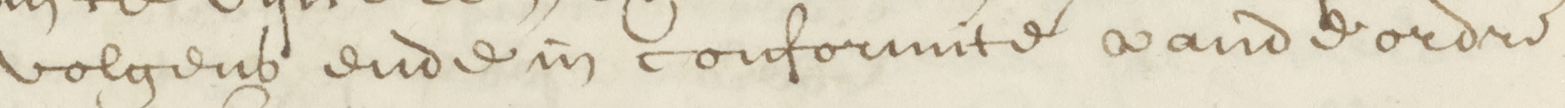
volgens ende in conformité vande ordre
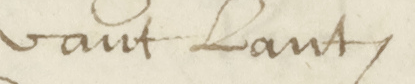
vant Lant.
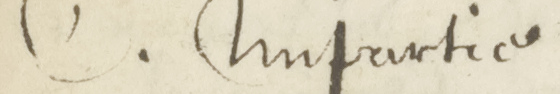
Ce. Mipartie
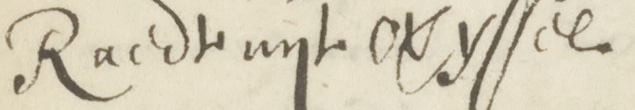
Raedt uijt Ovyssel
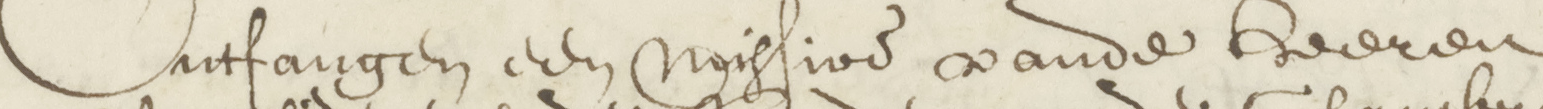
Ontfangen een Missive vande Heeren
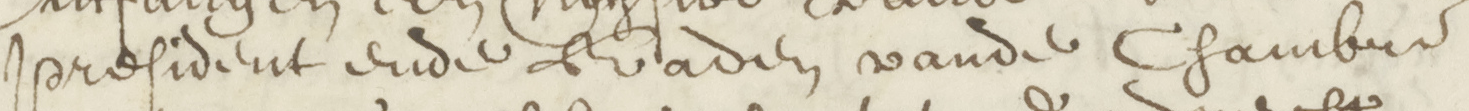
president ende Raden vande Chambre
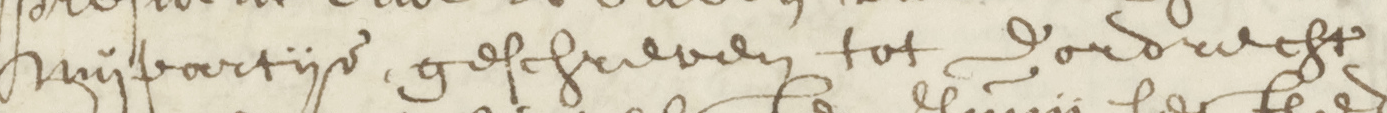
Mijpartije, geschreven tot Dordrecht
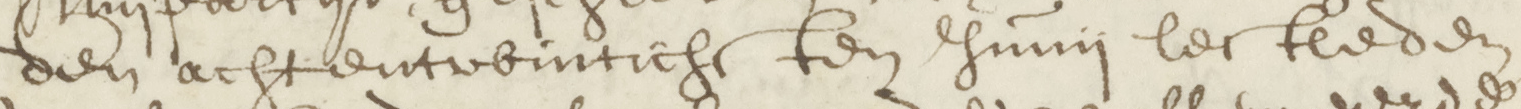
den achtentwintichsten Junij lestleden,
